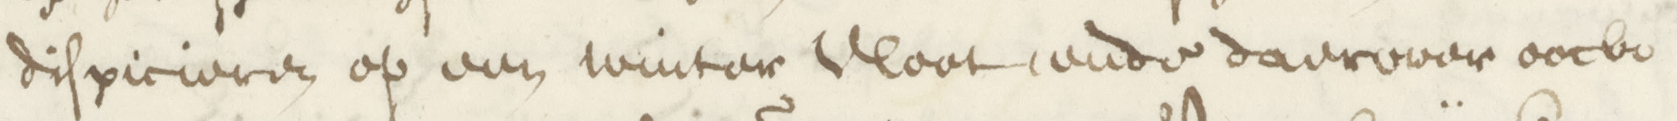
dispicieren op een winter Vloot, ende daervoor oock
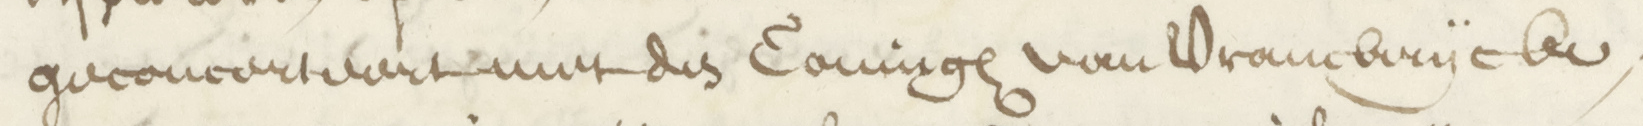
geconcerteert met den Coningh van Vranckrijck, -
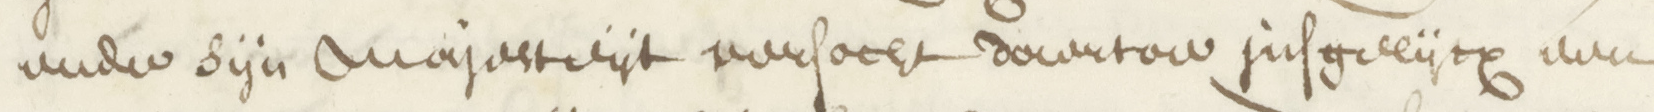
ende sijn Majesteijt versocht daertoe insgelijcx een
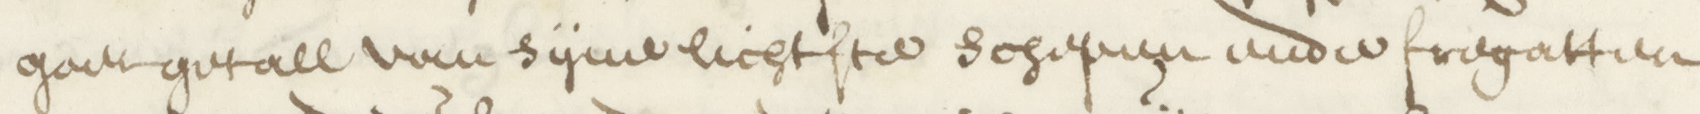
goet getall van sijne lichtste schepen ende fregatten
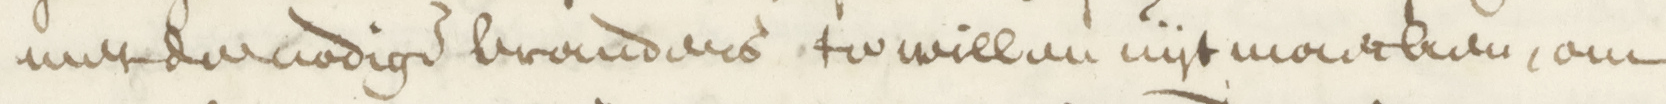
met de nodige branders te willen uijtmaecken, om
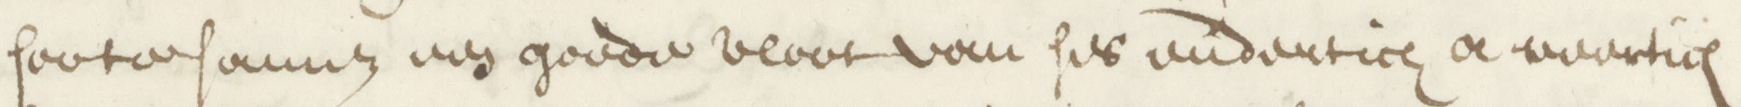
soo te samen een goede vloot van ses endertich a veertich
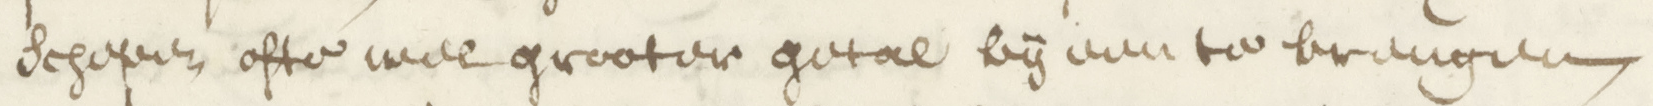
schepen ofte wel grooter getal bij een te brengen,
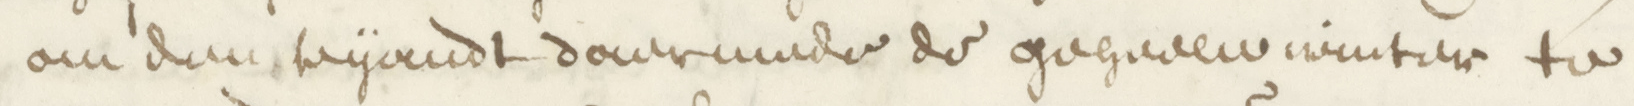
om den vijandt daermede de geheele winter te
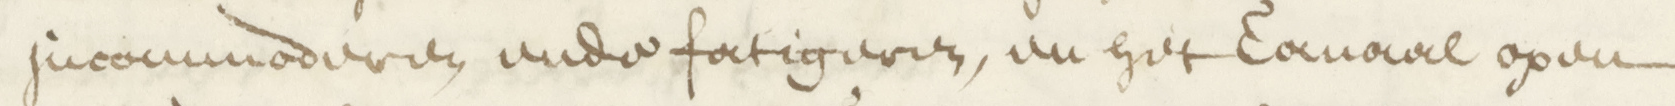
incommoderen ende fatigeren, en het Canaal open
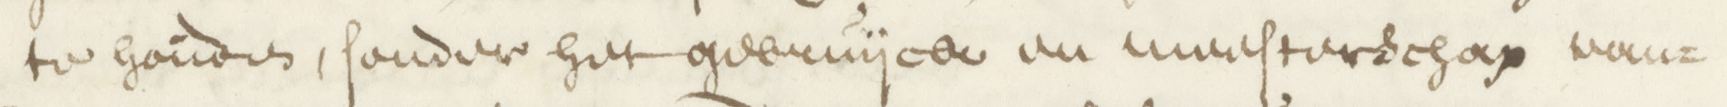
te houden, sonder het gebruijck en meesterschap van,,
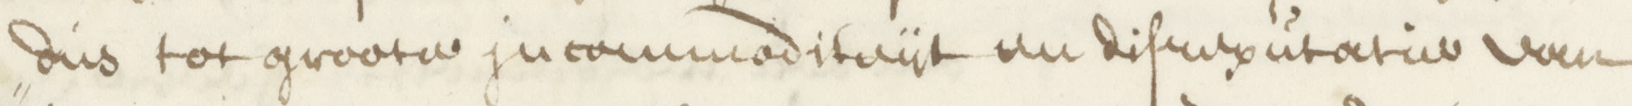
„dien tot groote incommoditeijt en disreputatie van
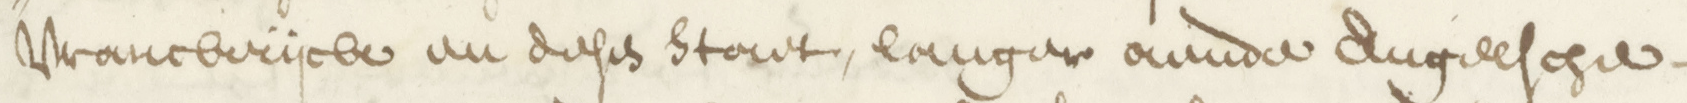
Vranckrijck en desen Staet, langer aende Engelsche
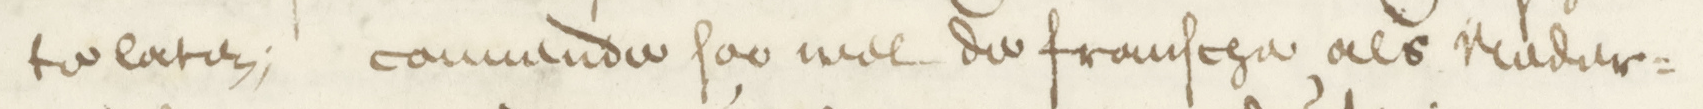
te laten; connende soo wel de fransche als Neder=
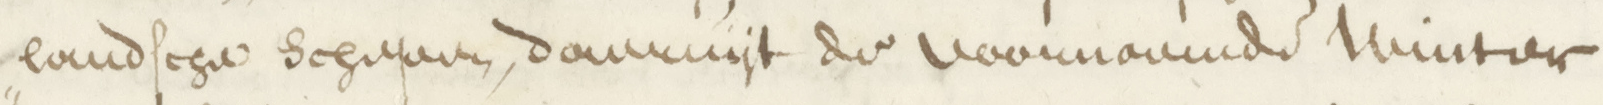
„landsche schepen, daeruijt de voornoemde winter
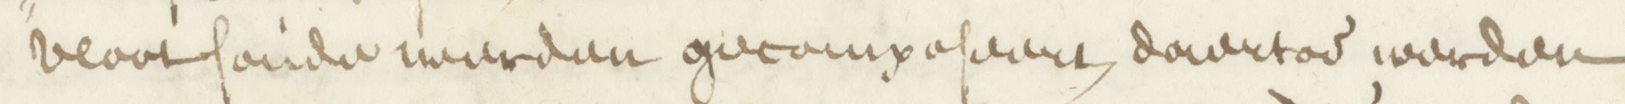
vloot soude werden gecomposeert, daertoe werden
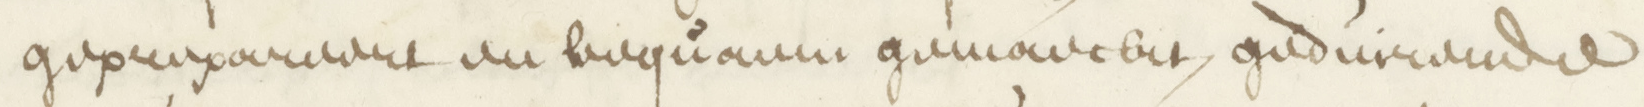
geprepareert en bequaem gemaeckt, geduirende
